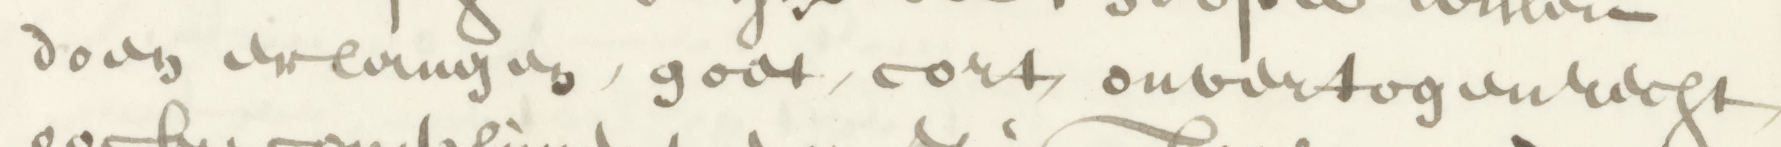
doen erlangen, goet, cort, onvertogen recht,
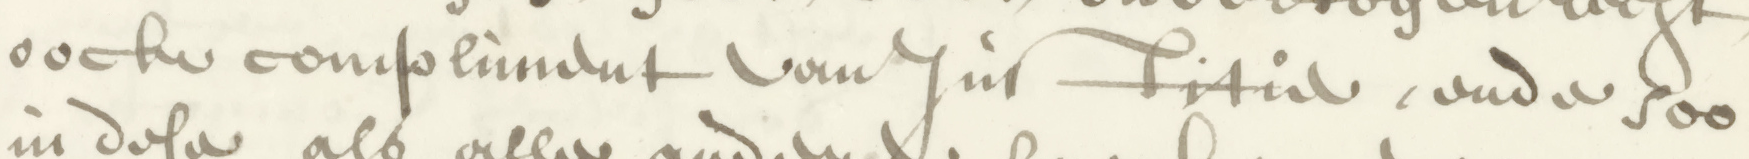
oock compliment van Justitie, ende soo
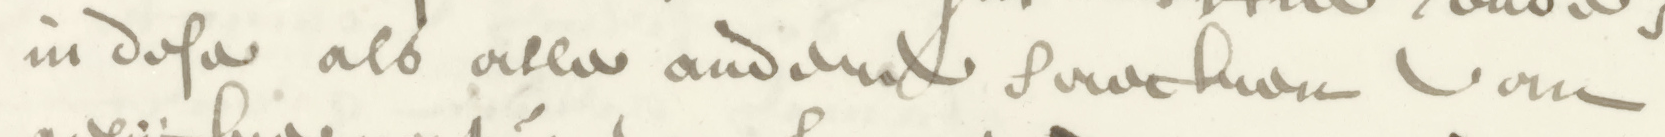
in dese als alle andere saecken van
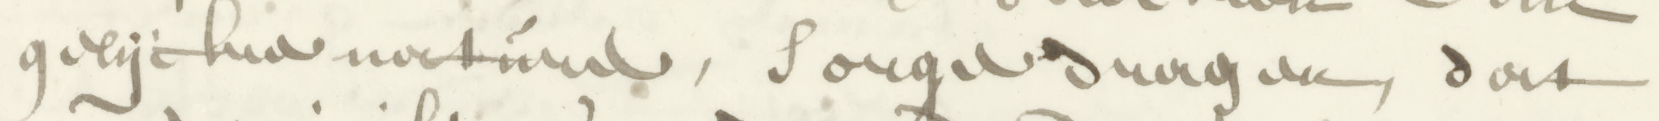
gelijcke nature, sorge dragen, dat
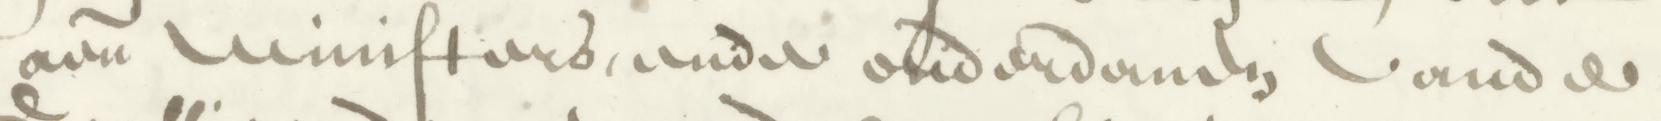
aen Ministers, ende onderdanen vande
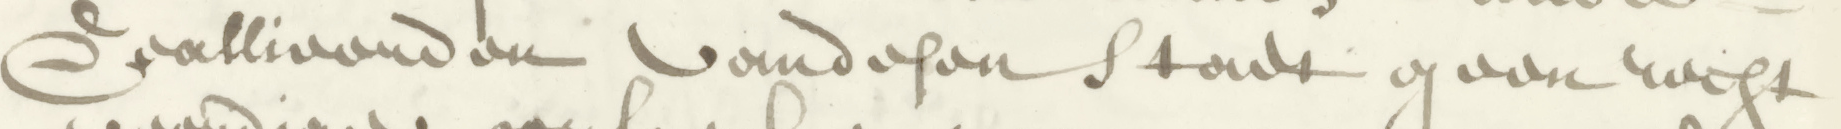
Geallieerden van desen Staet geen recht
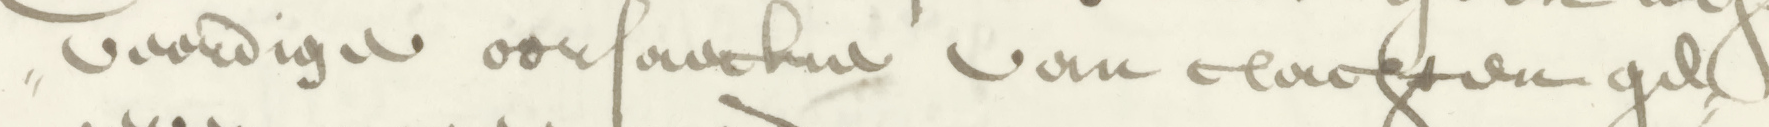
„veerdige oorsaecke van clachten ge„
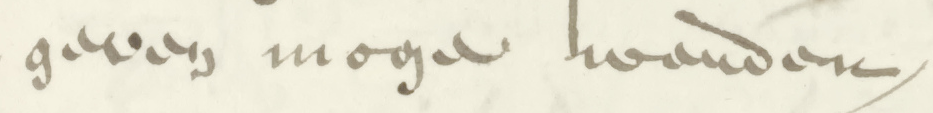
„geven moge werden.
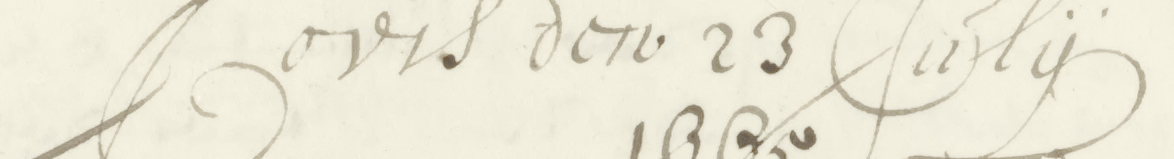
Jovis den 23 Julij
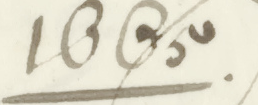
1665.
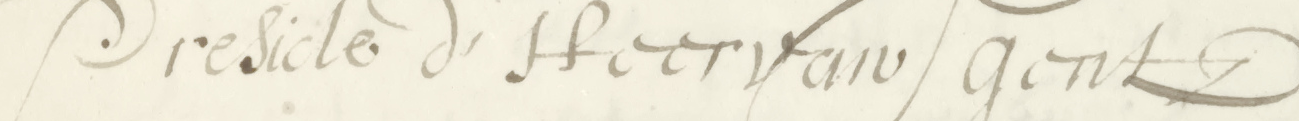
Preside d' Heer van gent
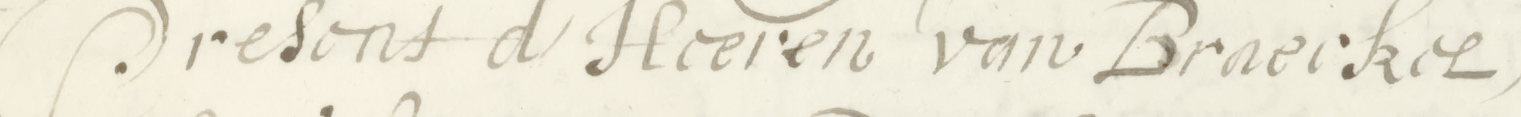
Present d'Heeren van Braeckel,
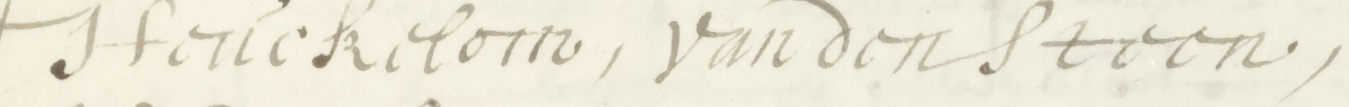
Heuckelom, vanden Steen,
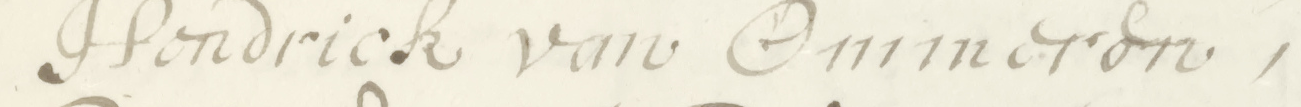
Hendrick van Ommeren,
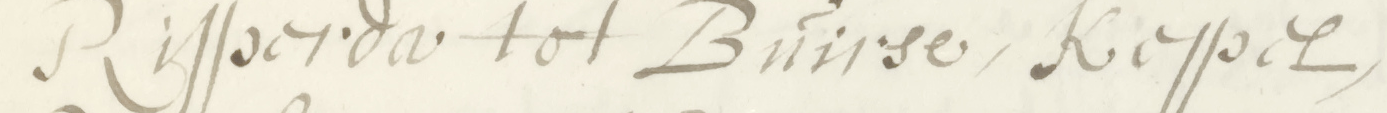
Ripperda tot Buirse, Keppel,
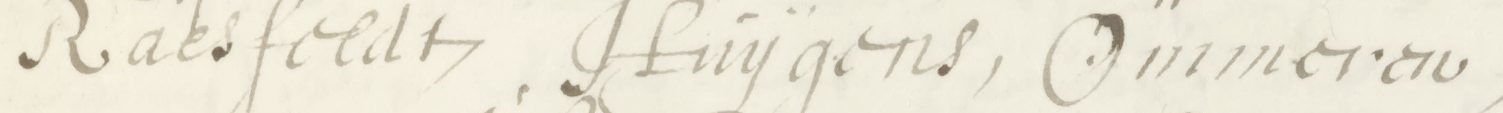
Raesfeldt, Huijgens, Ommeren,
